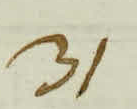31
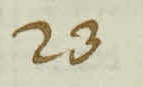23
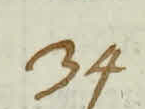34
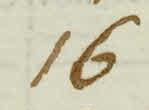16
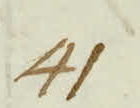41
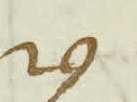29
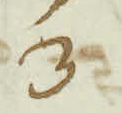3
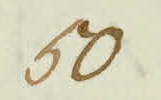50
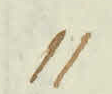11
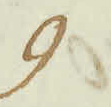9
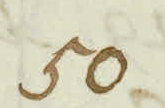50
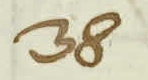38
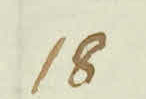18
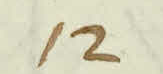12
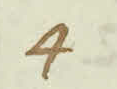4
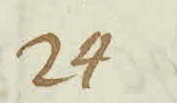24
